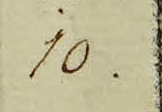10.
